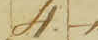4.
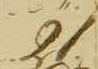21.
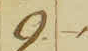9.
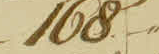168.
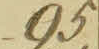95
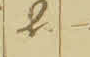2.
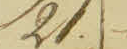21.
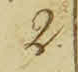2.
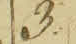3.
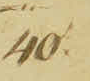40
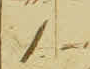1.
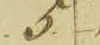5.
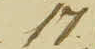17.
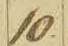10.
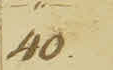40.
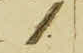1.
